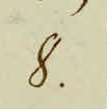8.
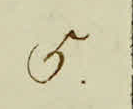5.
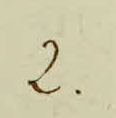2.
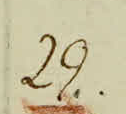29.
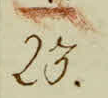23.
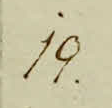19.
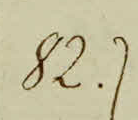82.
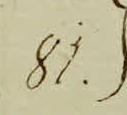81.
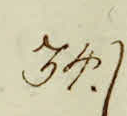34.
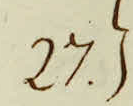27.
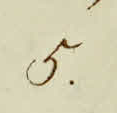5.
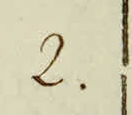2.
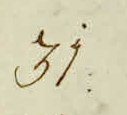31.
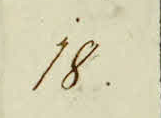18.
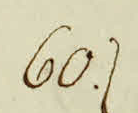60.
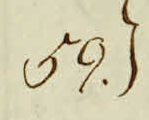59.
